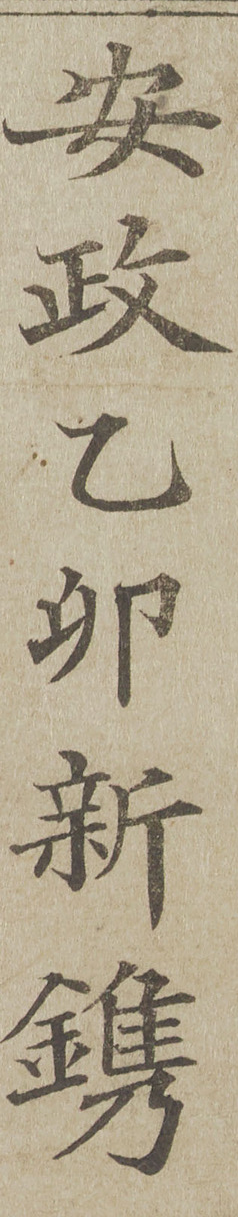安政乙卯新鎸
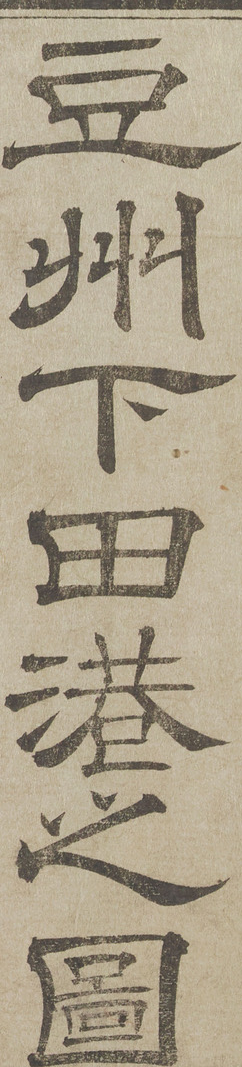豆州下田港之図
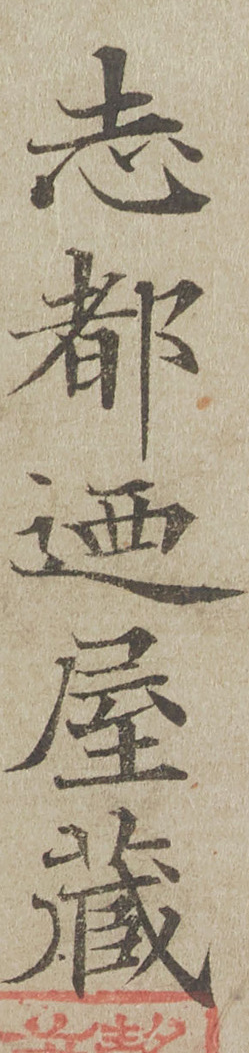志都迺屋蔵

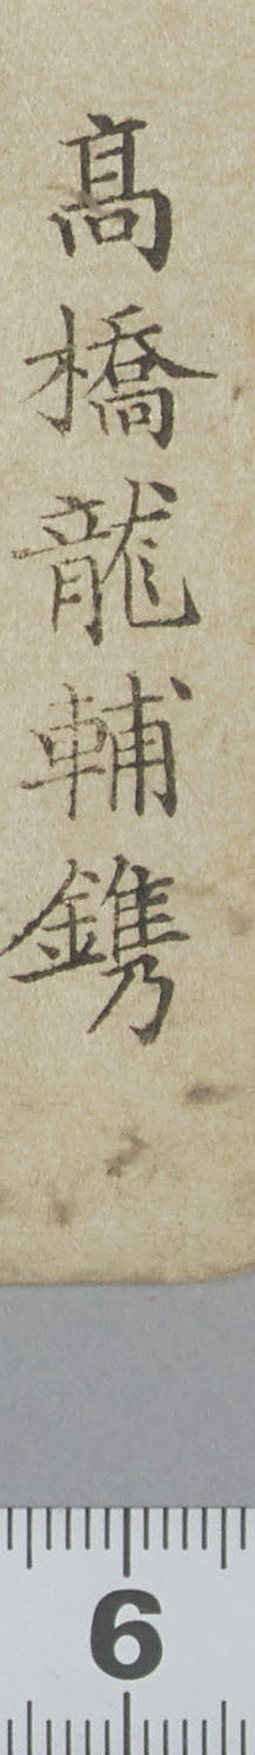髙橋龍輔鎸
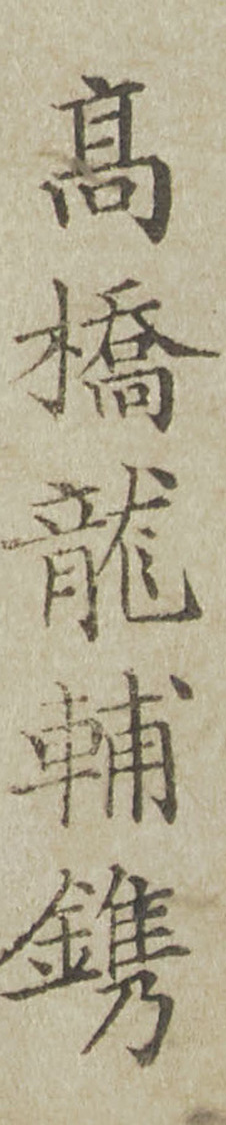髙橋龍輔鎸

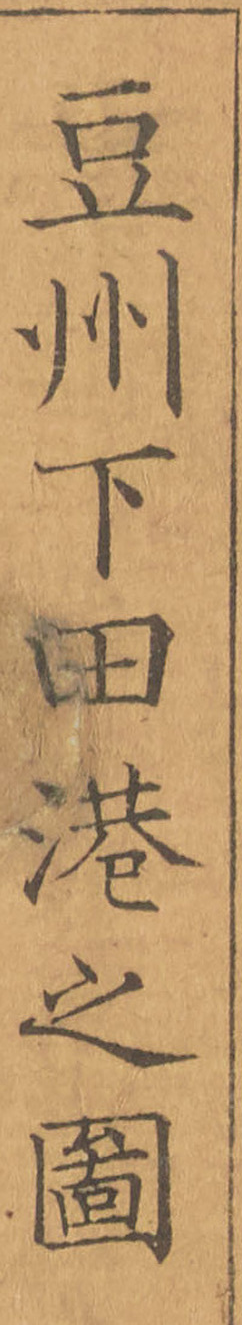豆州下田港ノ圖完
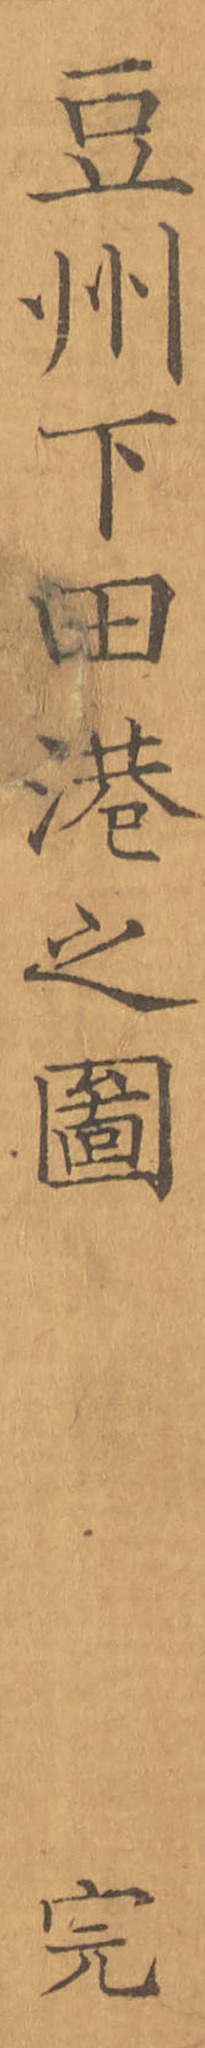豆州下田港ノ圖完

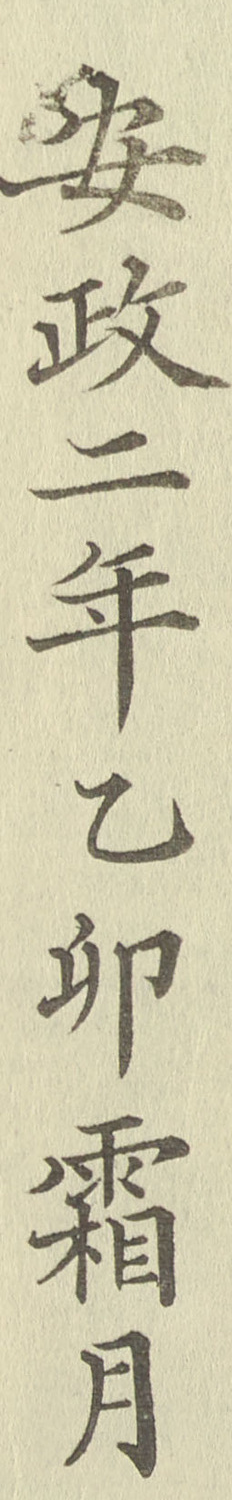安政二年乙卯霜月
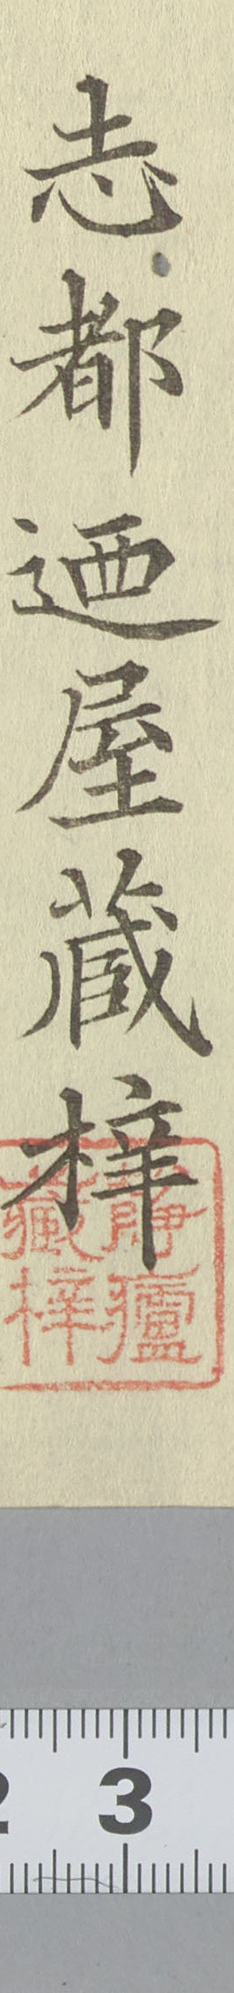志都迺屋蔵梓
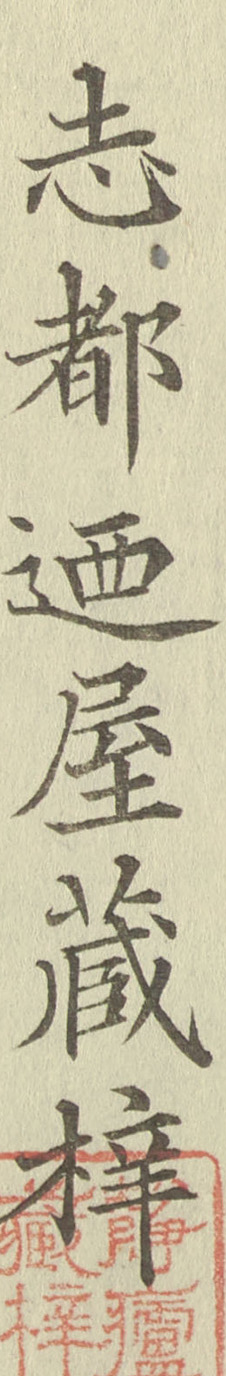志都迺屋蔵梓
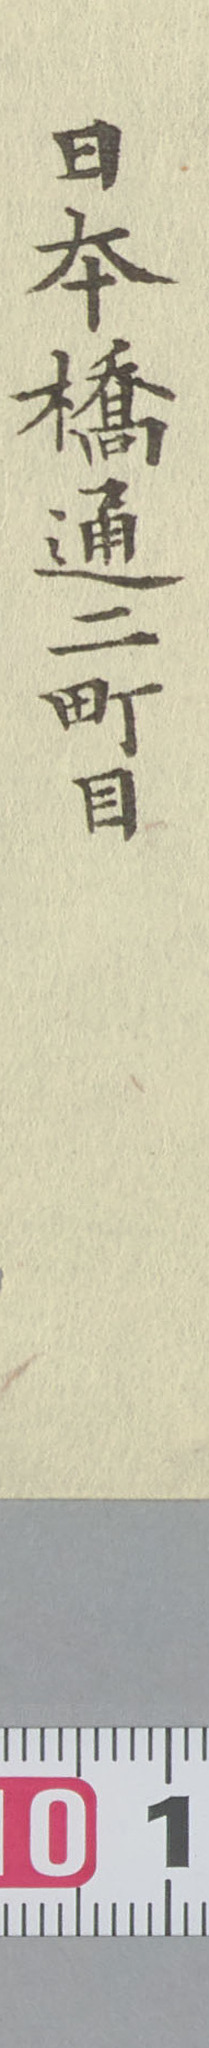日本橋通二丁目
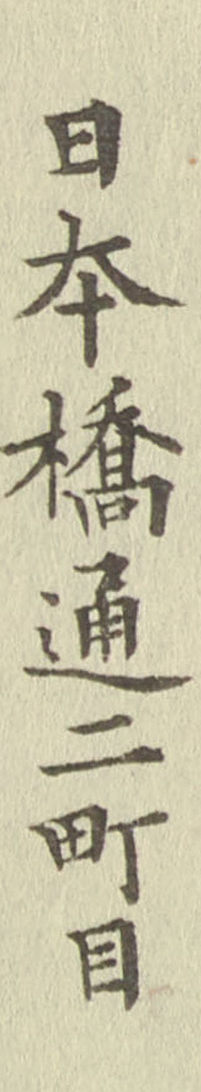日本橋通二丁目
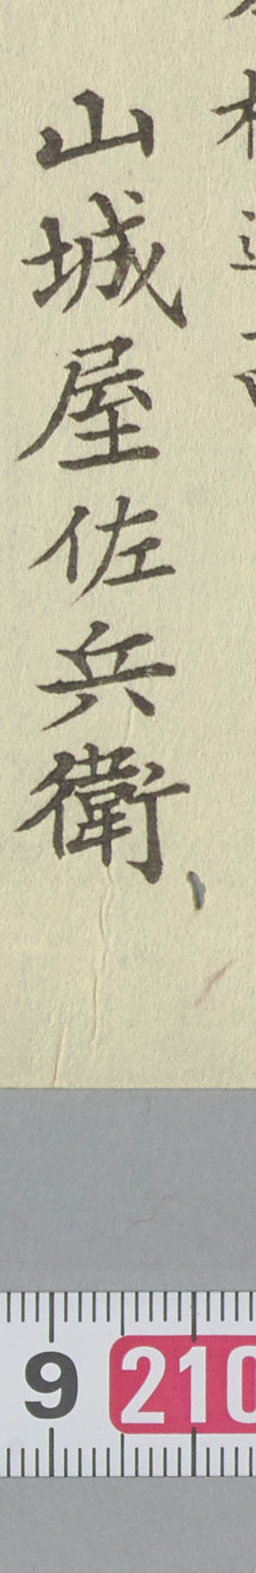山城屋佐兵衛
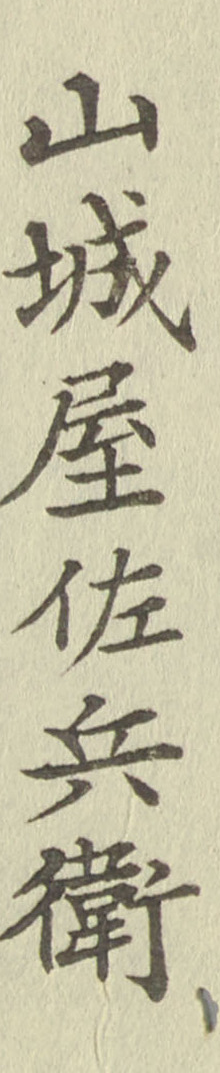山城屋佐兵衛
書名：豆州下田港之図
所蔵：東京大学総合図書館 General Library in the University of Tokyo, JAPAN
